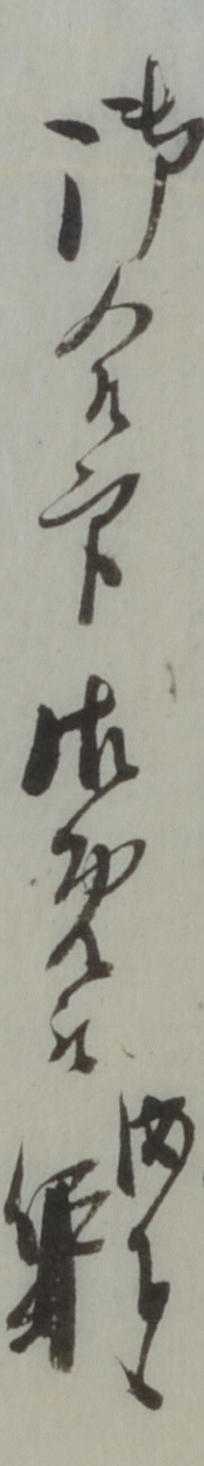御合印御免被成下候
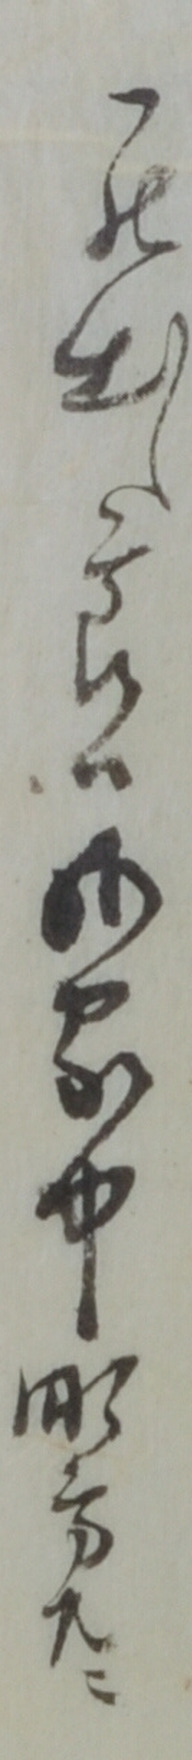罷出候節ハ御家中町方共ニ
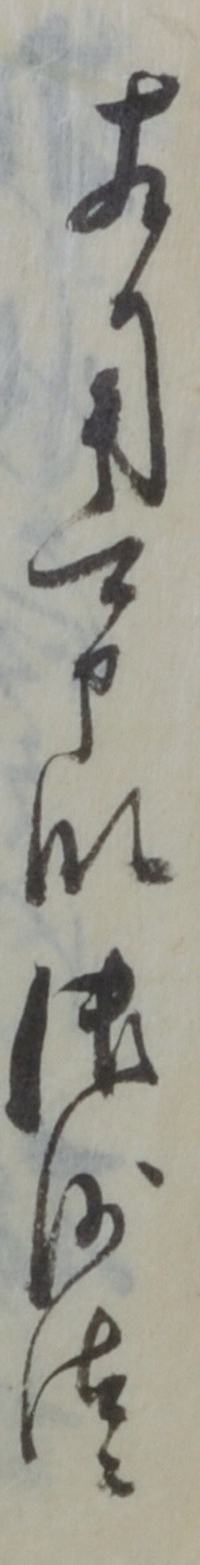相用可申段御沙汰ニ
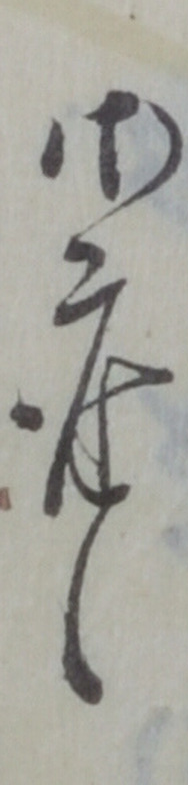御座候
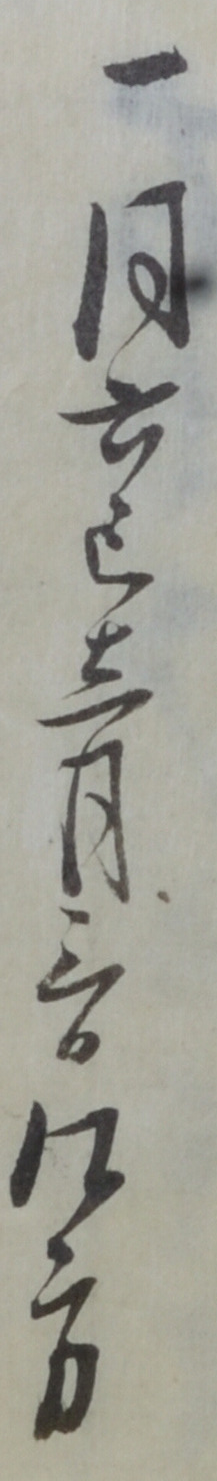一同六巳十二月三日郷方

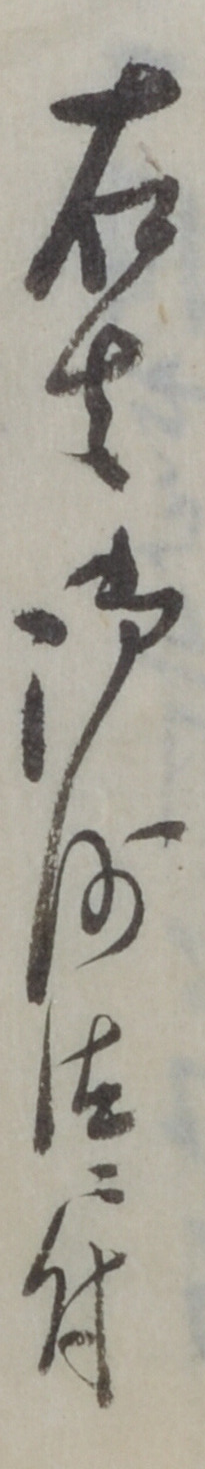右は御沙汰ニ付
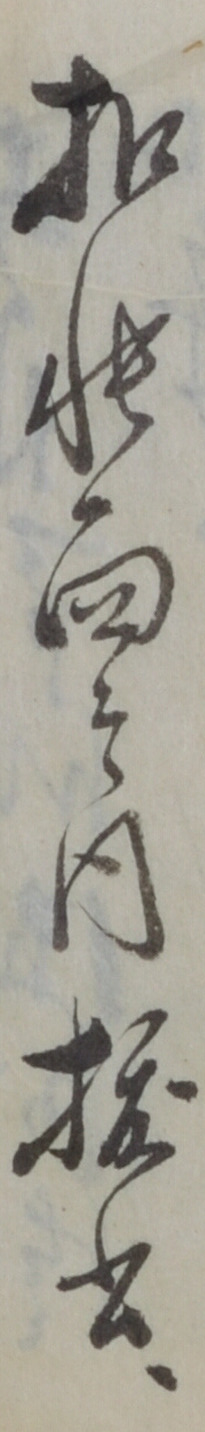控帳面之内抜書ニ
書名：抜書
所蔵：伊那市立高遠町図書館・合同会社AMANE
